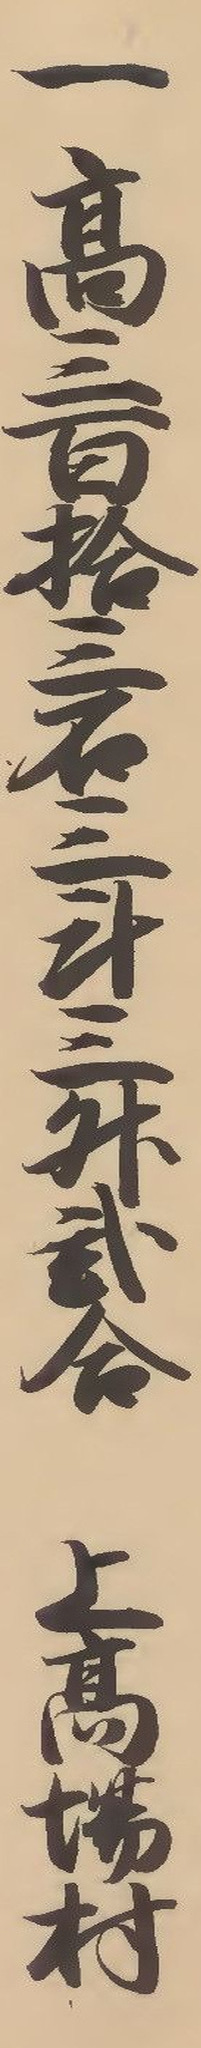一高三百拾三石三斗三升弐合上高場村
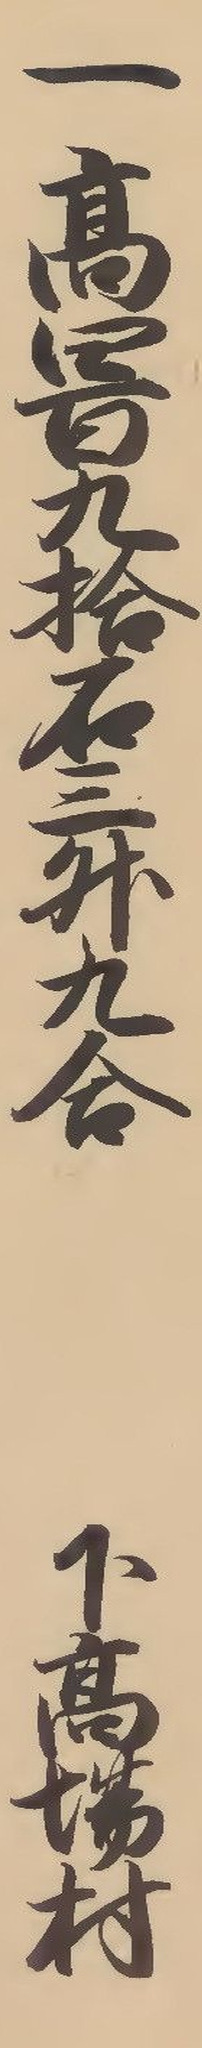一高四百九拾石三升九合下高場村
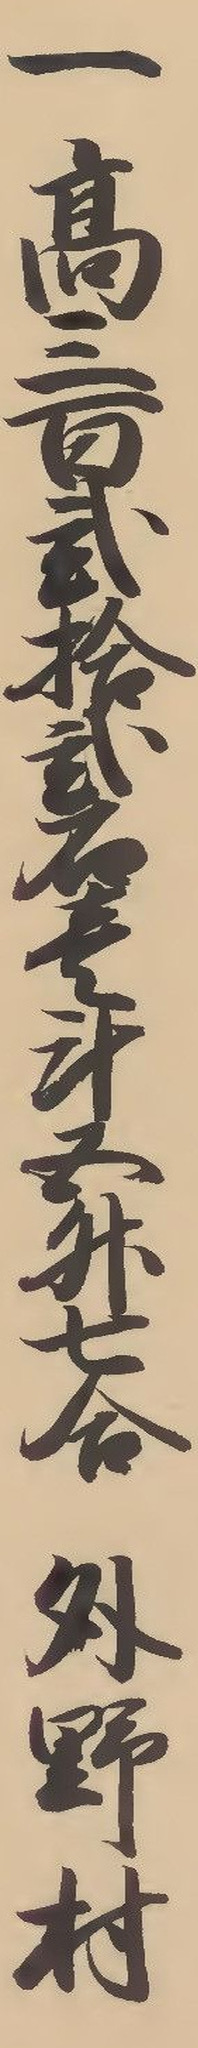一高三百弐拾弐石壱斗五外七合外野村

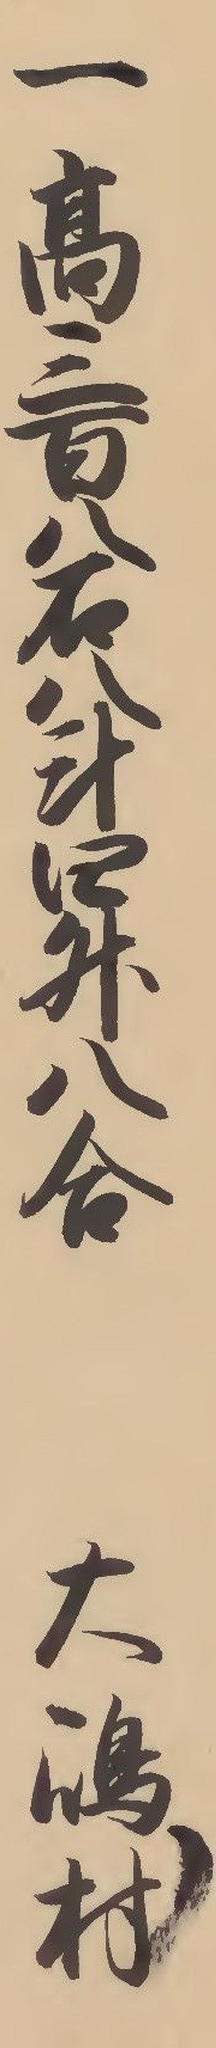一高三百八石八斗四升八合大島村
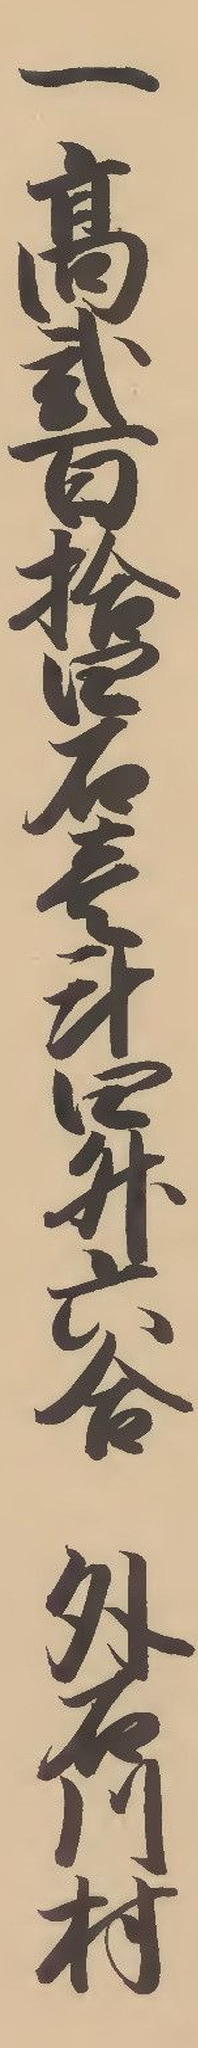一高弐百拾四石壱斗四升六合外石川村
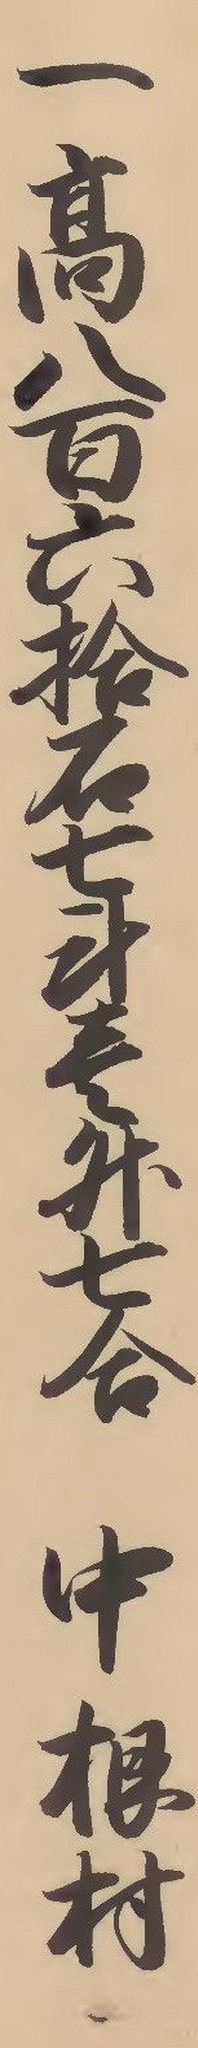一高八百六拾石七斗壱升七合中根村
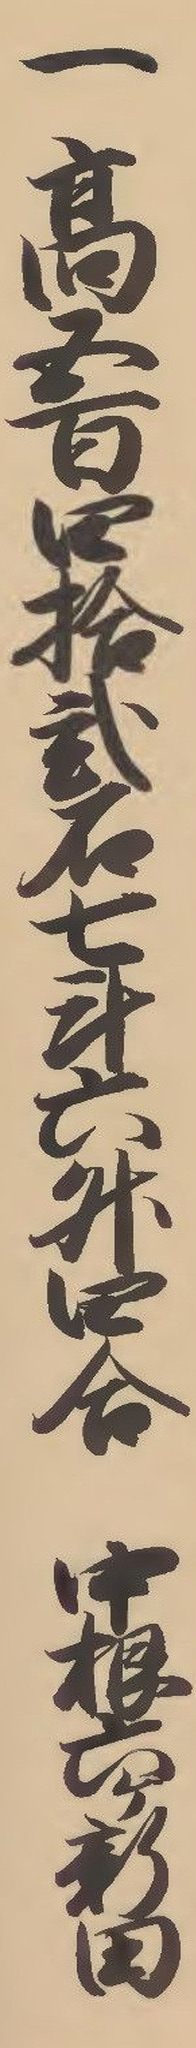一高五百四拾弐石七斗六升四合中根六ヶ新田
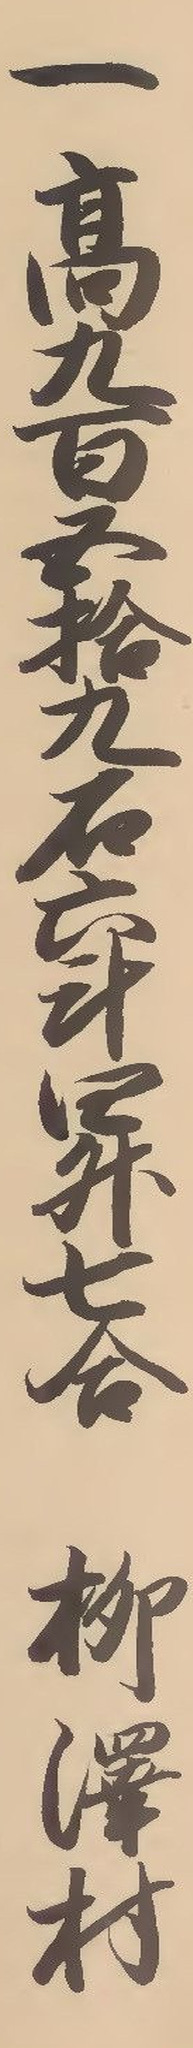一高九百五拾九石六斗四升七合柳沢村
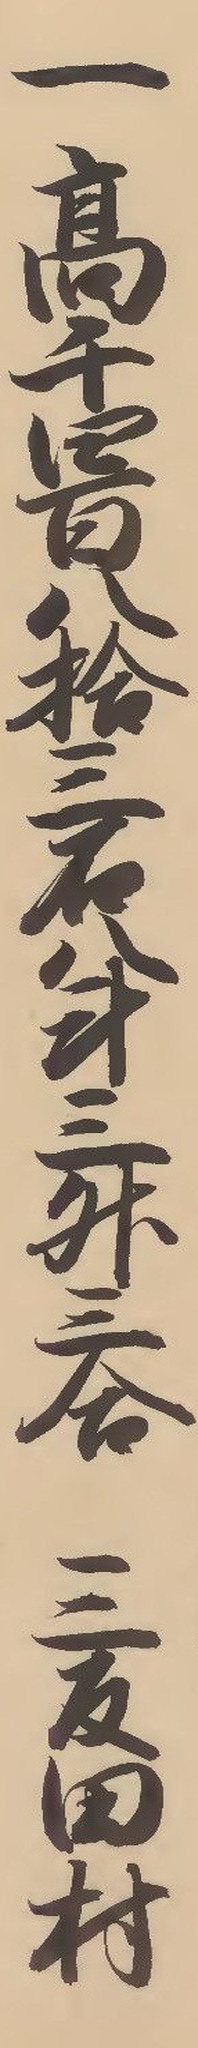一高千四百八拾三石八斗三升三合三反田村
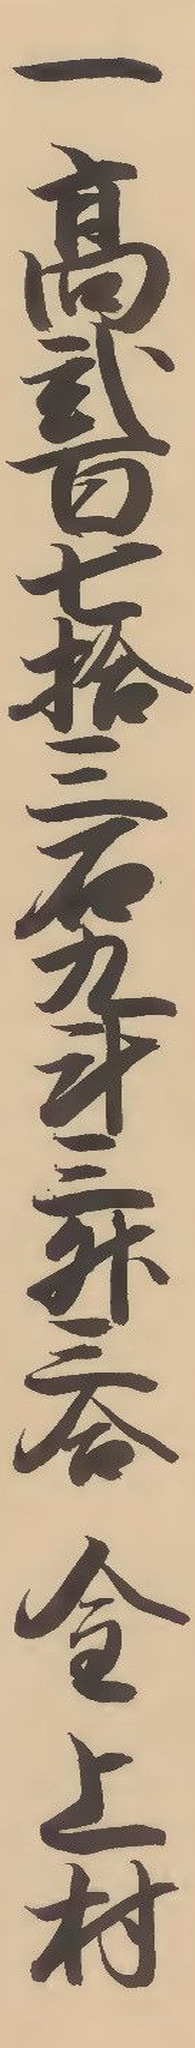一高弐百七拾三石九斗三升三合金上村
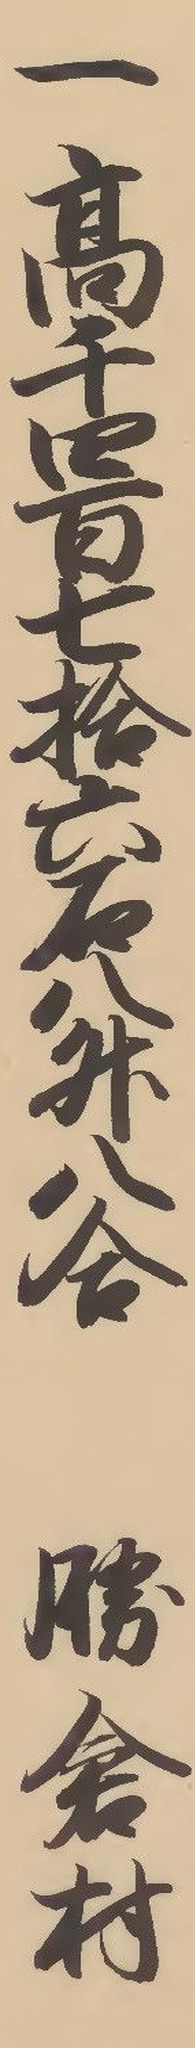一高千四百七拾六石八升八合勝倉村

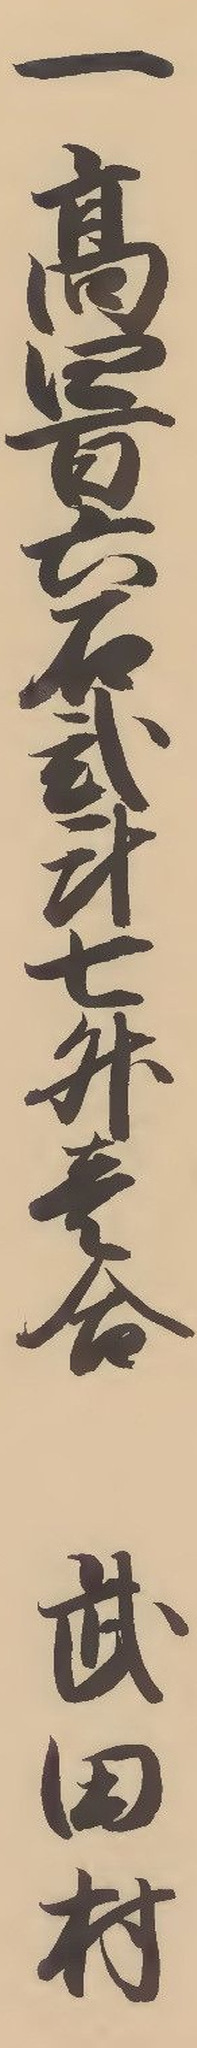一高四百六石弐斗七升壱合武田村
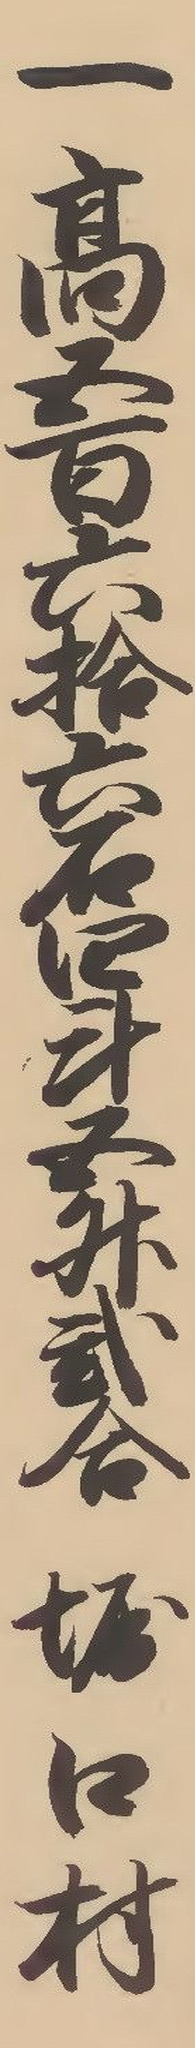一高五百六拾六石四斗五升弐合堀口村
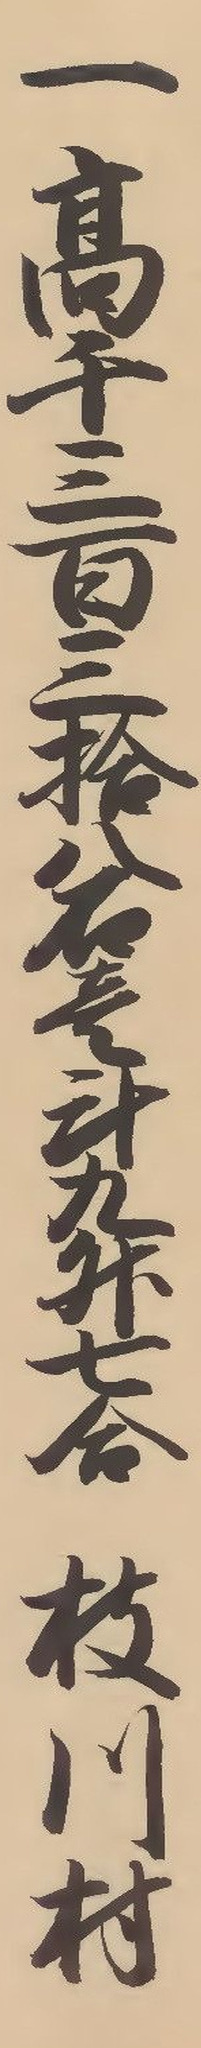一高千三百三拾八石壱斗九升七合枝川村
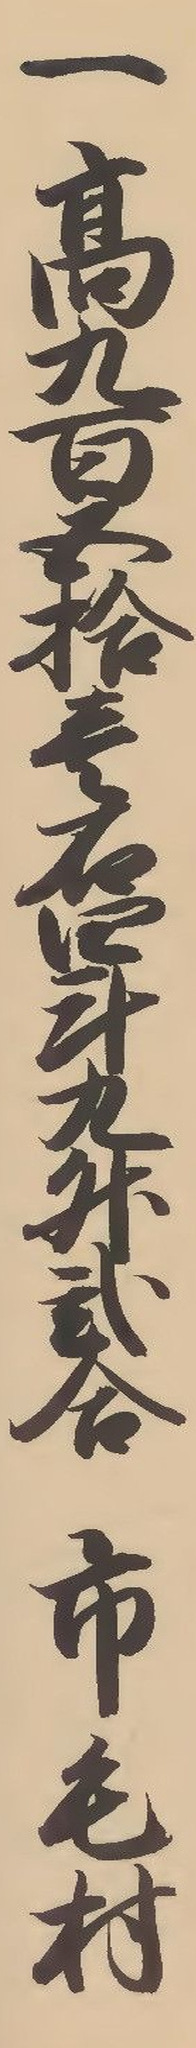一高九百五拾壱石四斗九升弐合市毛村
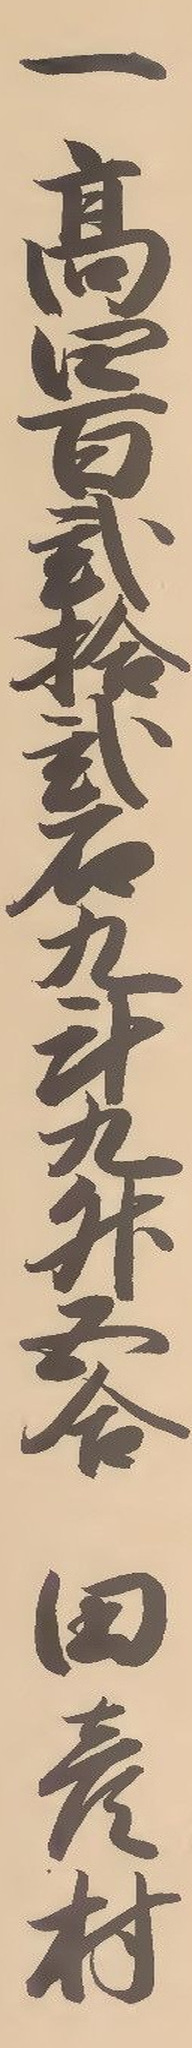一高四百弐拾弐石九斗九升五合田彦村
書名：常陸国郷帳
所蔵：国立公文書館 National Archives of Japan
